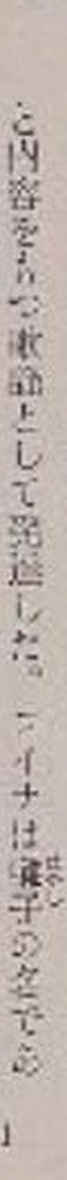と内容をもつ歌謡として発達した。コイナは囃子の名であ
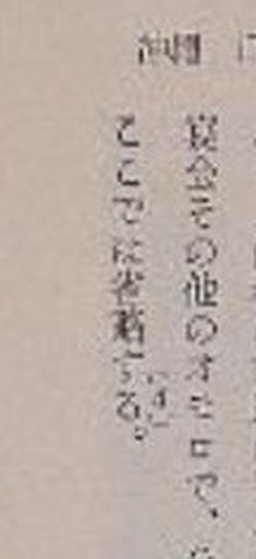ここでは省略する。
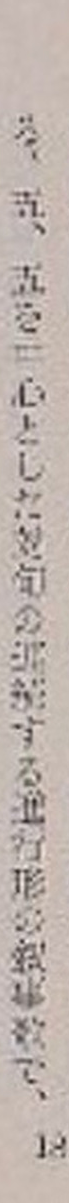る。五、五を中心とした対句の連続する進行形の叙事歌で、

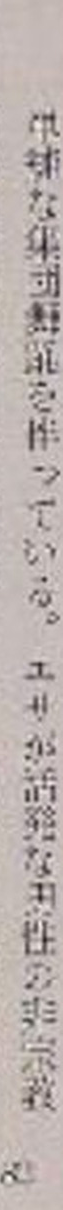単純な集団舞踊を作っている。エサが活発な男性の非宗教
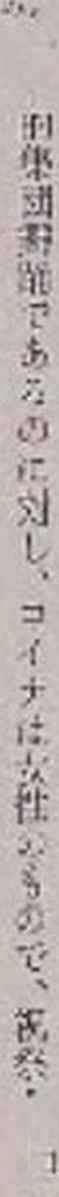的集団舞踊であるのに対し、コイナは女性のもので、祝祭・
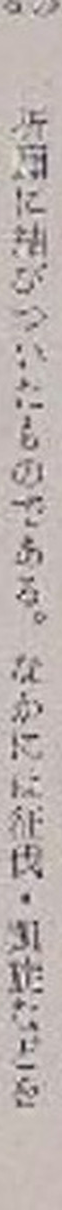祈願に結びついたものである。なかには征伐・凱旋などを
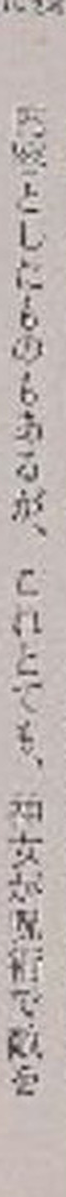内容としたものもあるが、これとても、神女が呪術で敵を
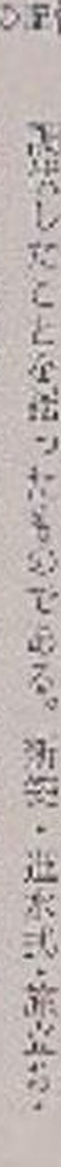調伏したことを謡ったものである。新築・進水式・旅立ち・
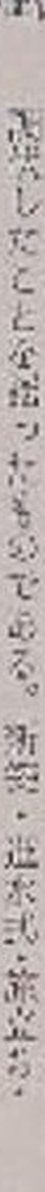調伏したことを謡ったものである。新築・進水式・旅立ち・
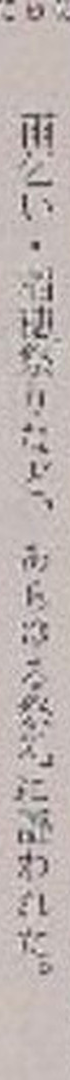雨乞い・稲穂祭りなど、あらゆる祭礼に謡われた。
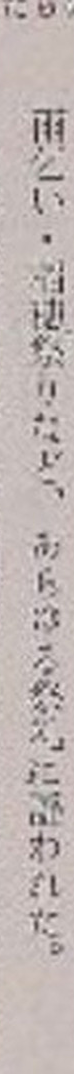雨乞い・稲穂祭りなど、あらゆる祭礼に謡われた。
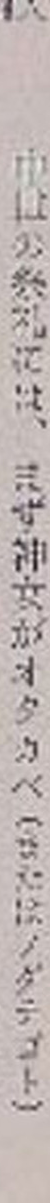中世の祭礼では、まず神女がオタカベ(またはノダテゴト)
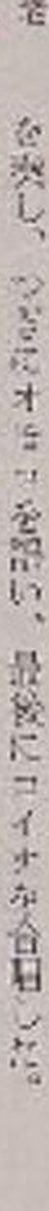を奏し、つぎにオモロを謡い、最後にコイナを合唱した。
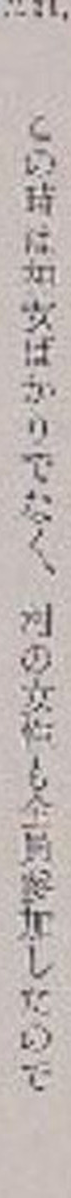この時は神女ばかりでなく、別の女性も全員参加したので
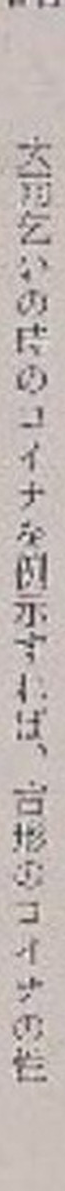大雨乞いの時のコイナを例示すれば、古形のコイナの性
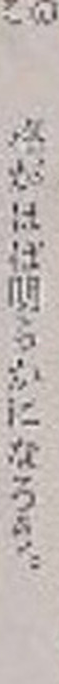格がほぼ明らかになろう。
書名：沖縄口承文芸
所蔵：University of the Ryukyus Library
